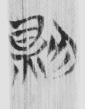則
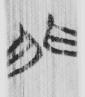非
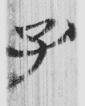子
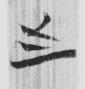之
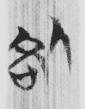咎
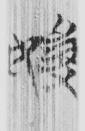{女尃}
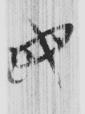母
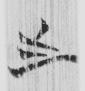之
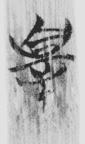辠
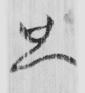也
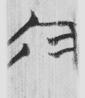今
